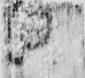左
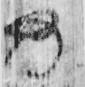尹
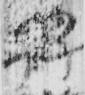與
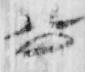公
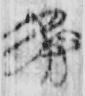賜
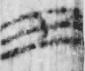王
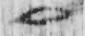厶（私）
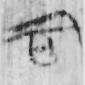司
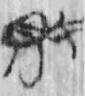敗
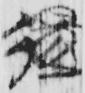逿
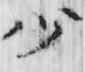少
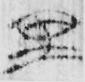里
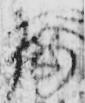喬
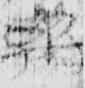與
